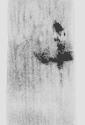七
